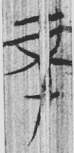不
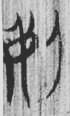死
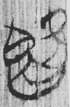既
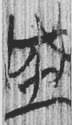城（成）
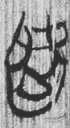既
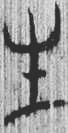生
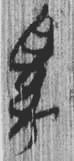○（奚）
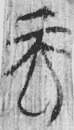而
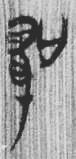鳴
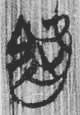既
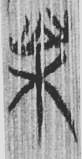本B（本）
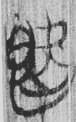既
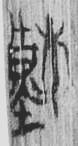槿（根）
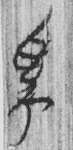奚（奚）
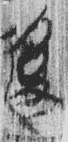後
